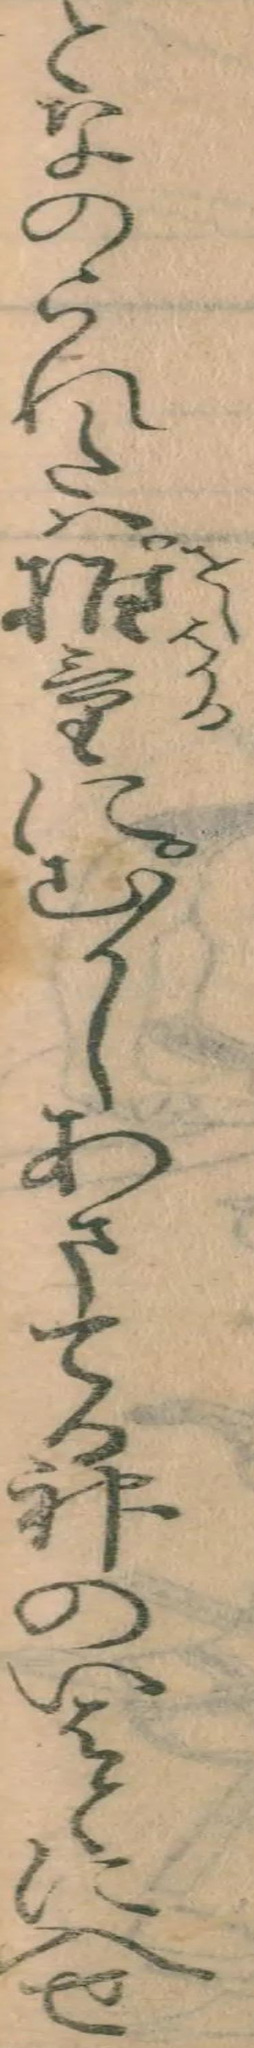となのられたは。推量に。むかしあまてる神のいはとに入せ
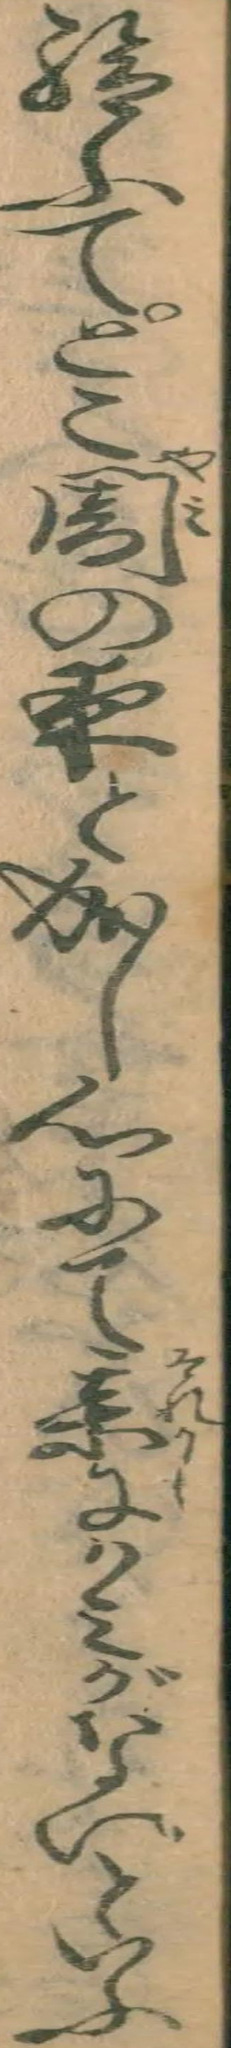給ふて。とこ闇の夜と成し心にて某にかみがないといふ
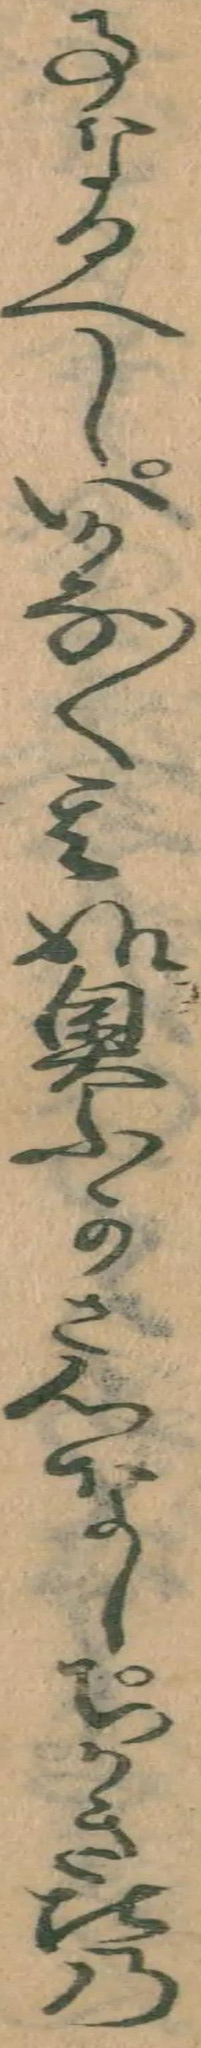事なるへし。いかな〳〵其様奥ふかさ心なし。ちかき比の
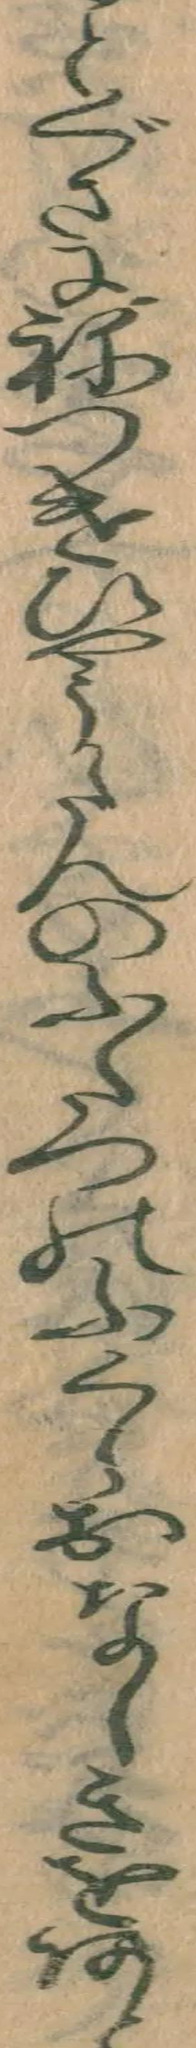ことぐさにねつけひやうたんのふたつのふくらおなしきをあと
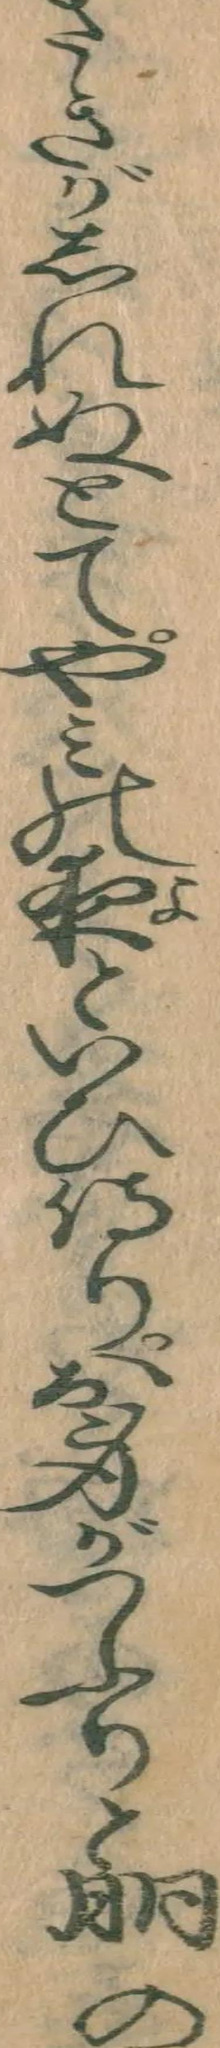さきがしれぬとて。やみの夜といひ侍り。お身がつふりと胴の
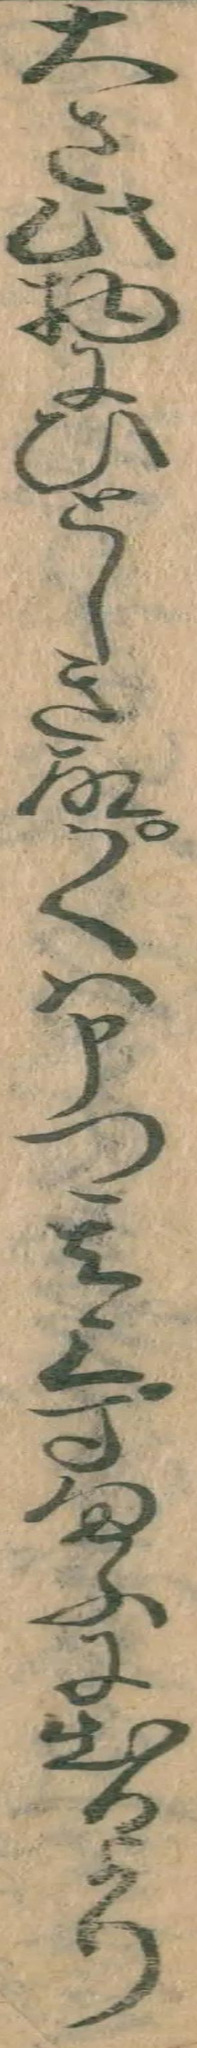大さ此物にひとしき故。かくは申つ其上すまふに出るより
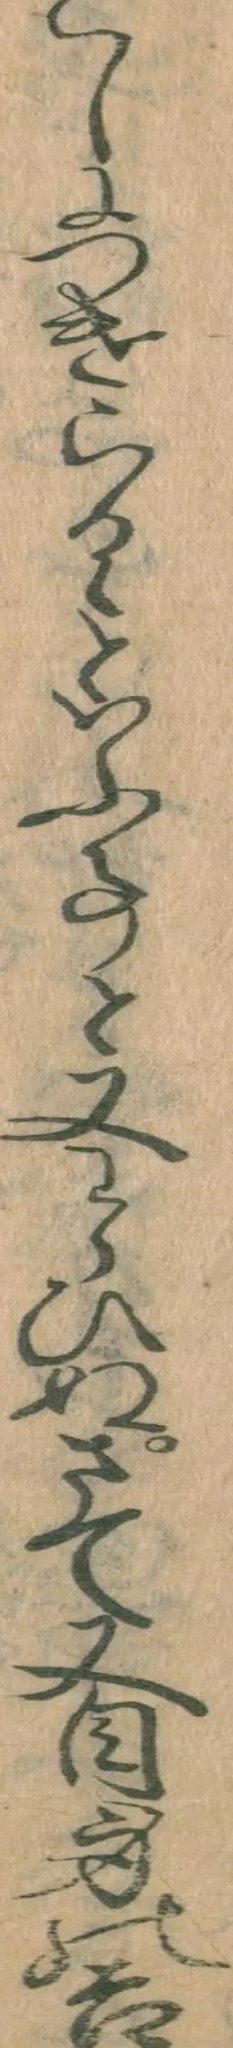こしにつけらるゝといふ事と又わらひぬ。さて又自身の吉
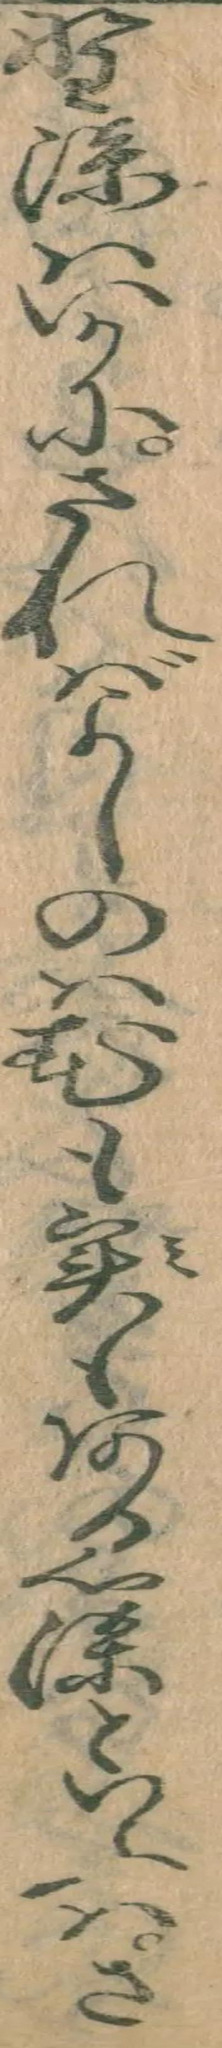野漆はいかに。さればよしのは花も実もある心漆といふは。さ
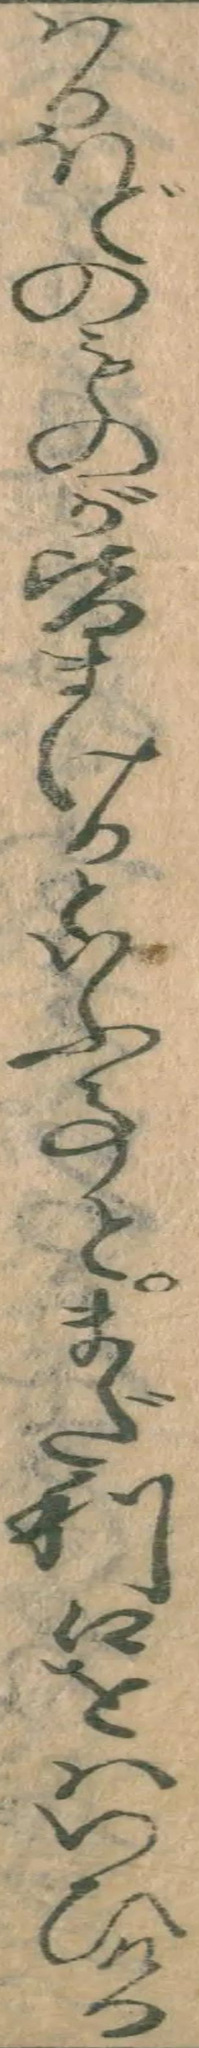はるほどのものが皆まけるといふ事と。まだ利口をはいひける
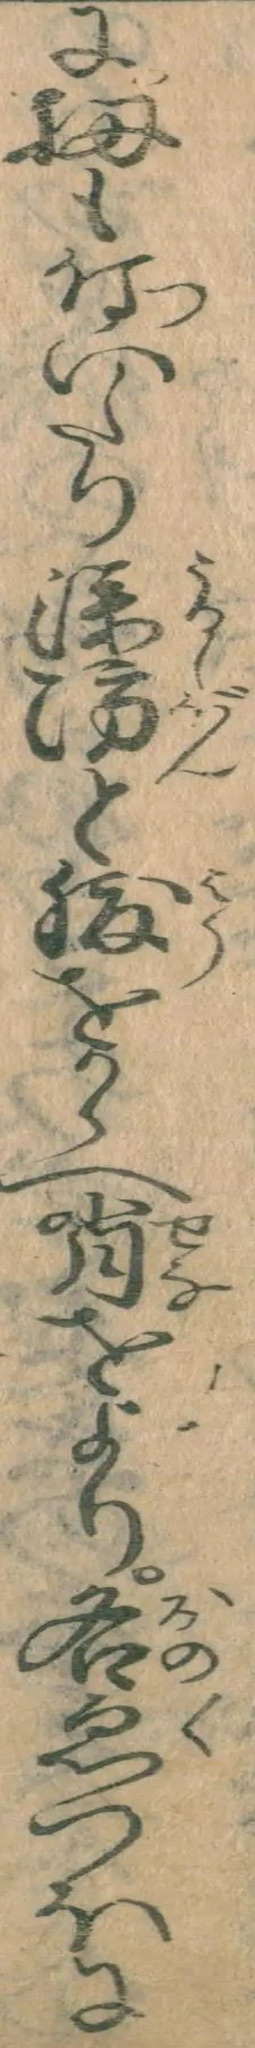に扨も付いたり漆坊と腹をかゝへ背をより。各ゑつほに
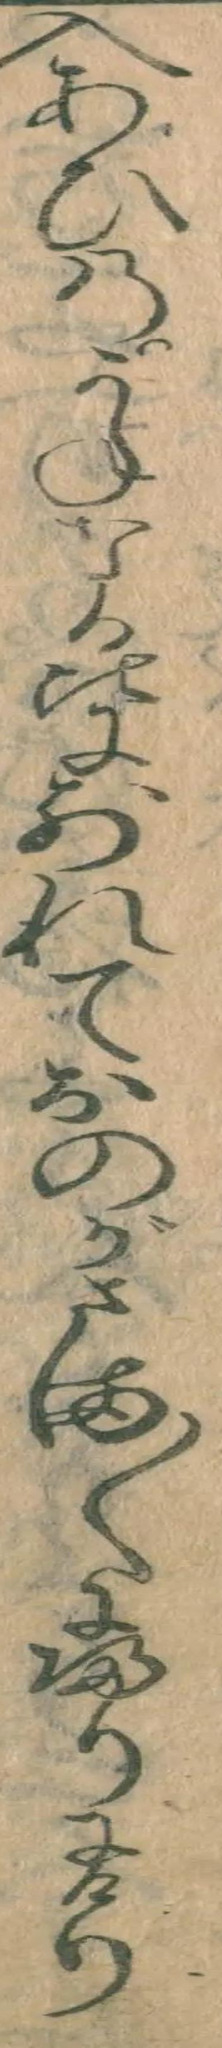入あひの。かねなる比に別れておのがさま〳〵に帰りにけり

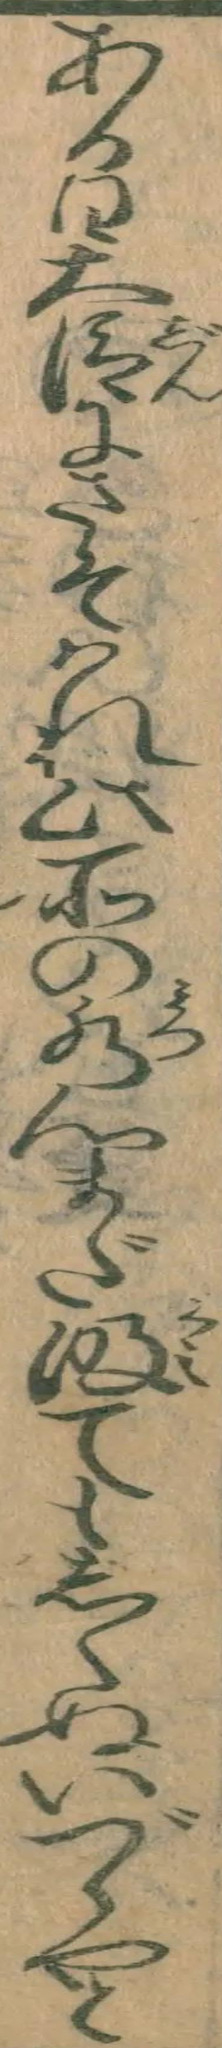ある日大臣にさそはれ此所の水心まだ汲てもしらぬいづくやと
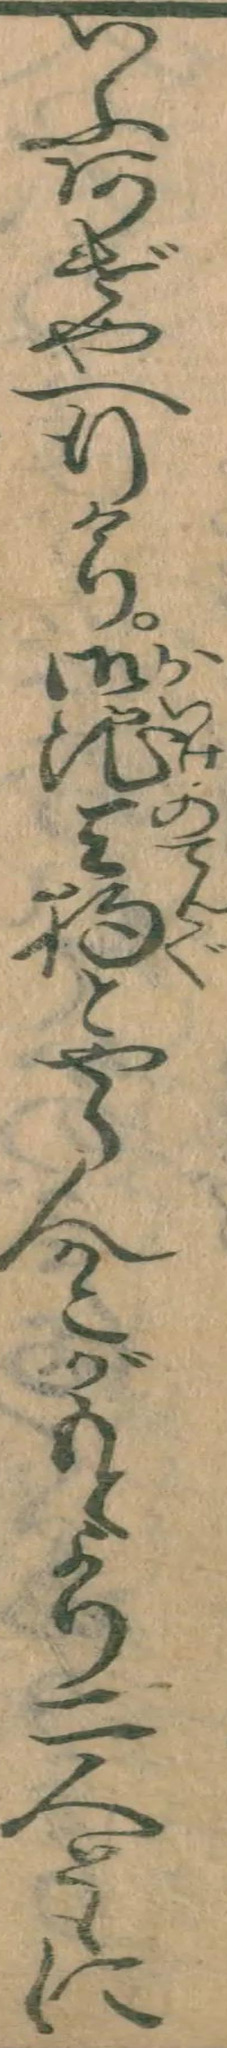いふあげやへ行けり。御池天狗とやらんかこがもとより二人ともに
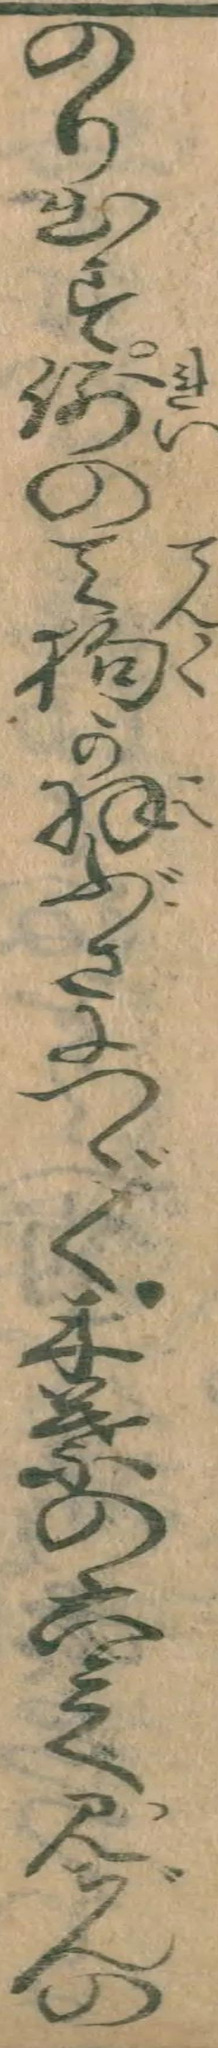のり出す。例の天狗か羽ぶさにつゞく木葉の六兵衛。見ぢんの
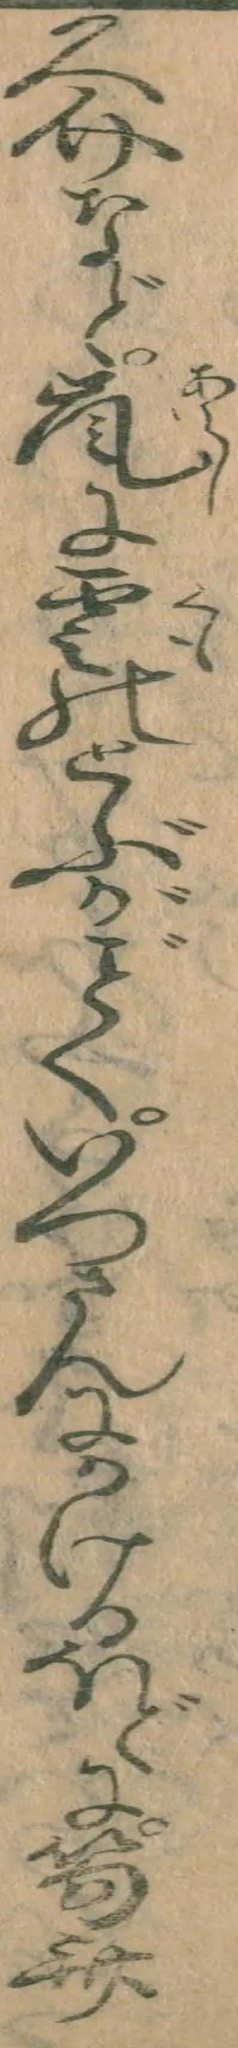久介など。嵐に雲のとぶがごとく。いつさんにかけるほどに。筍斎
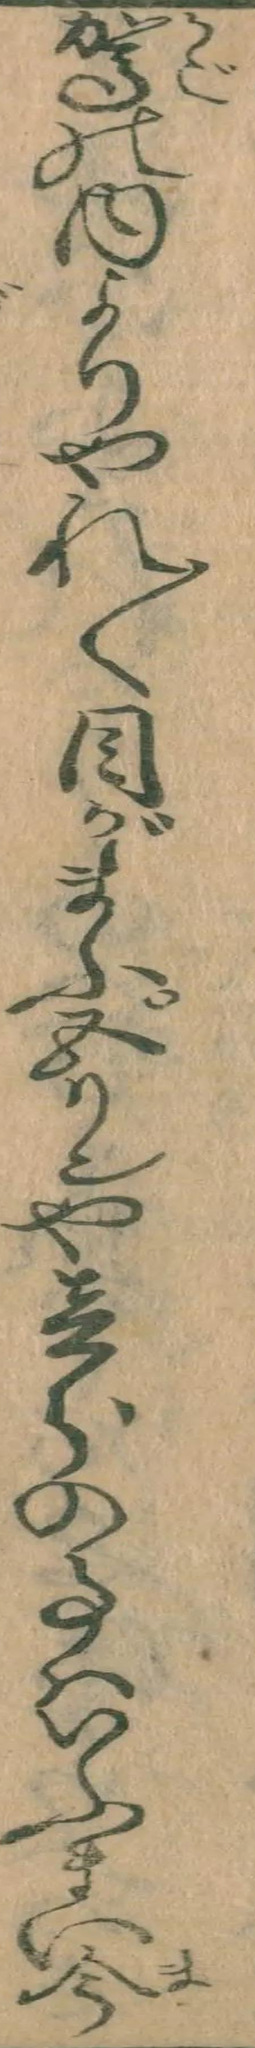駕の内よりやれ〳〵目がまふ。五リンや壱分の事はいふまい今
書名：新竹斎 5巻
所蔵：国立国会図書館 National Diet Library, JAPAN
